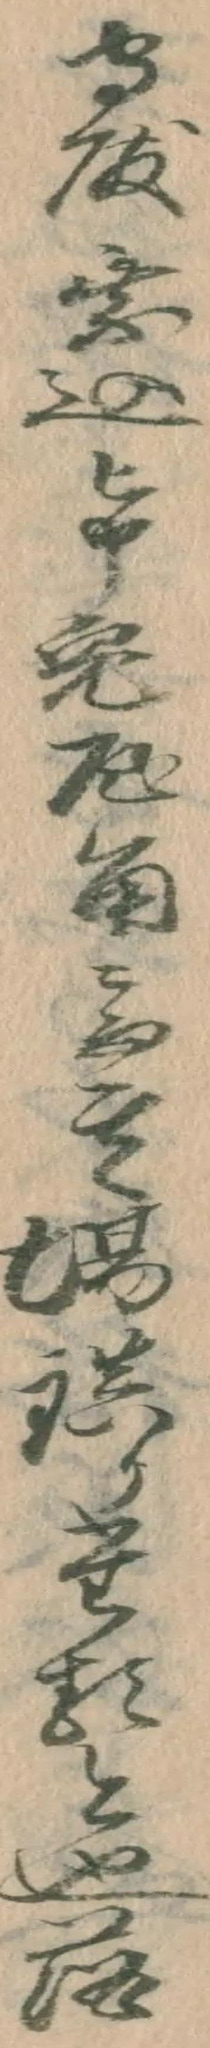守殿乗込被申兎屋角に而其場鎮り堂類と也落
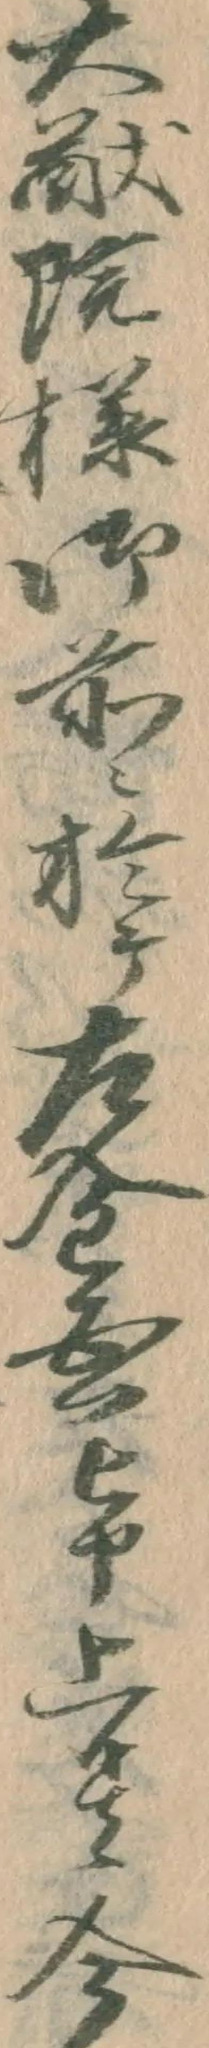大猷院様御前に於て左金吾被申上候者今
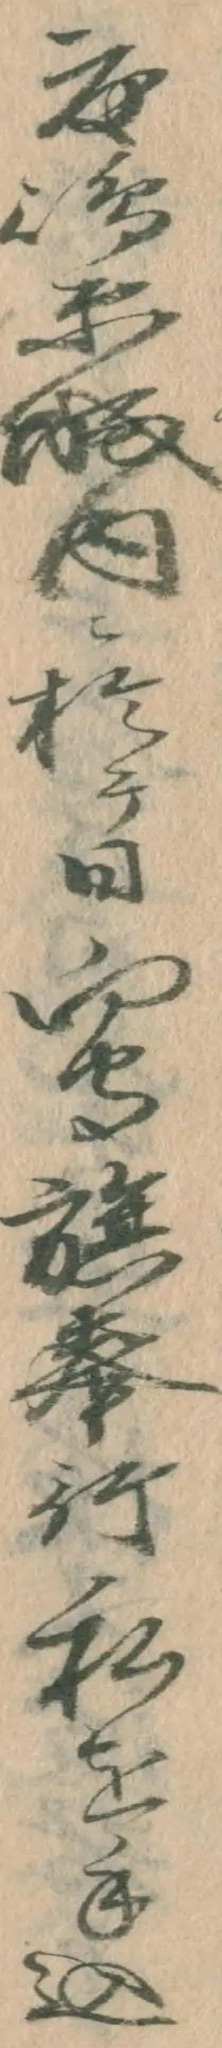度島原城内に於て日向守旗奉行私を手込
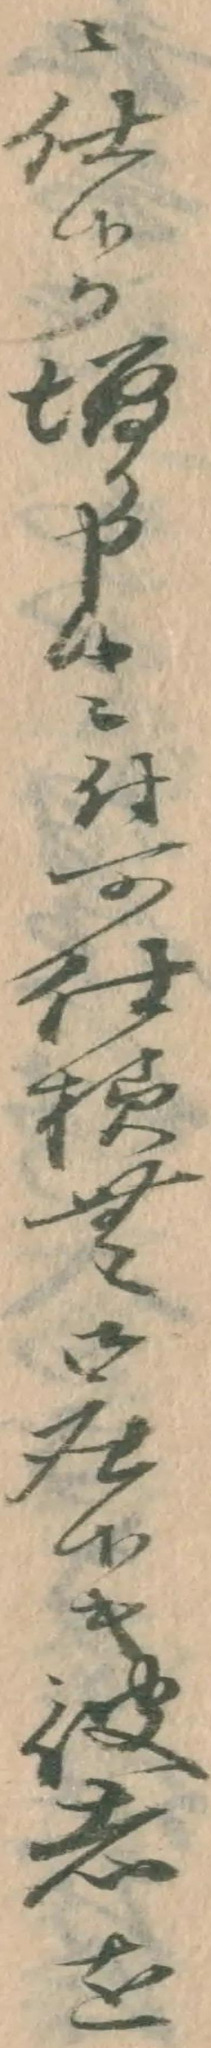に仕候か増り申候に付可仕様無御座候き彼者を

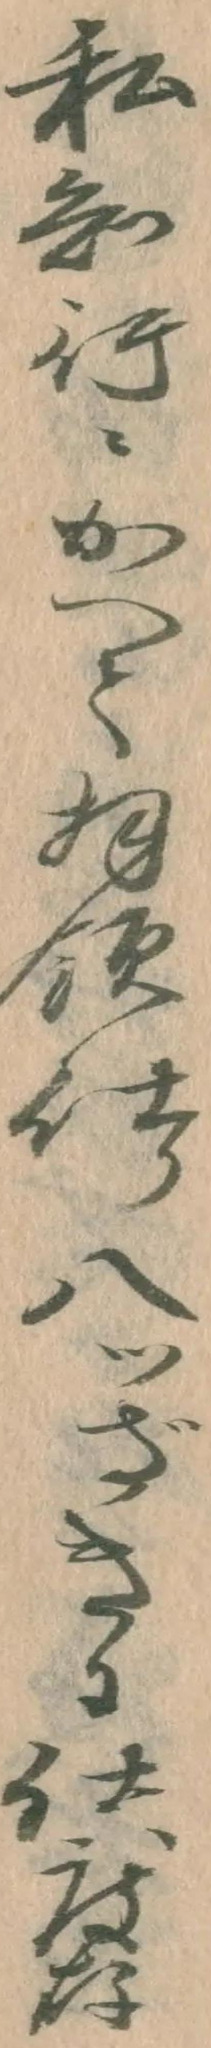私知行にかへて拝領仕り八つざき尓仕度存
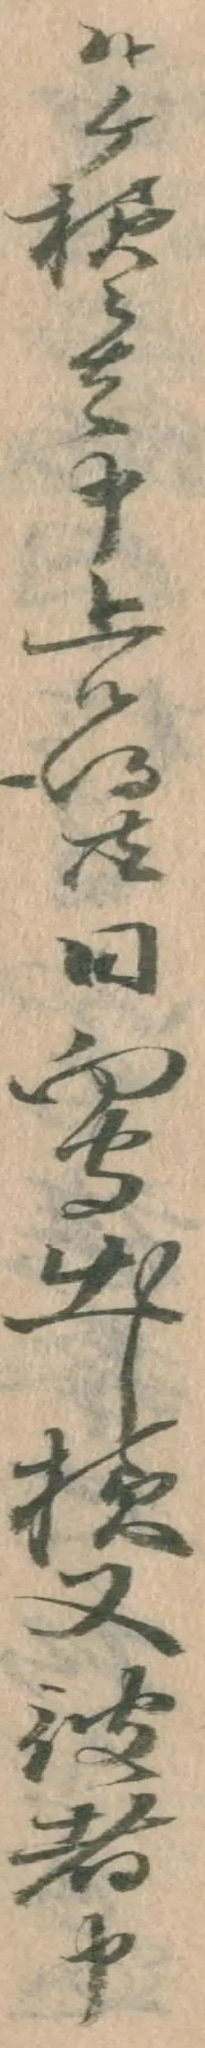候け様に者申上候得共日向守出し様又彼者申
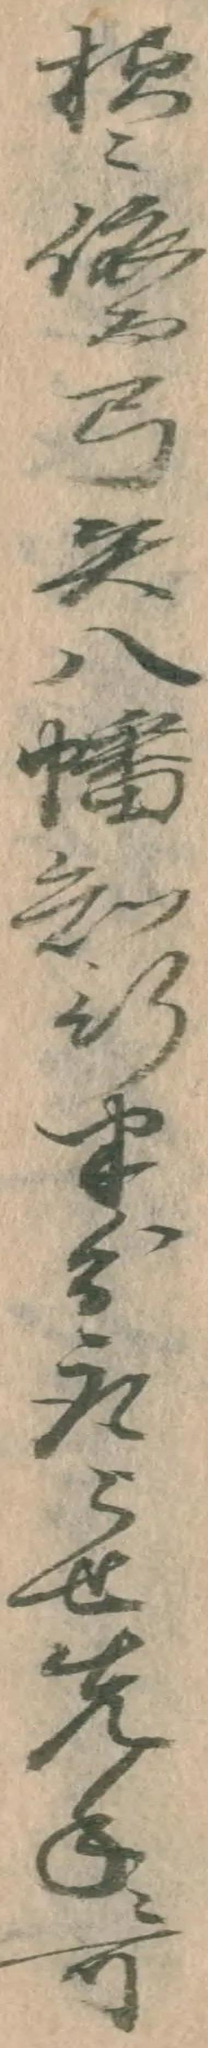様に依而弓矢八幡知行半分取らせ先手に可
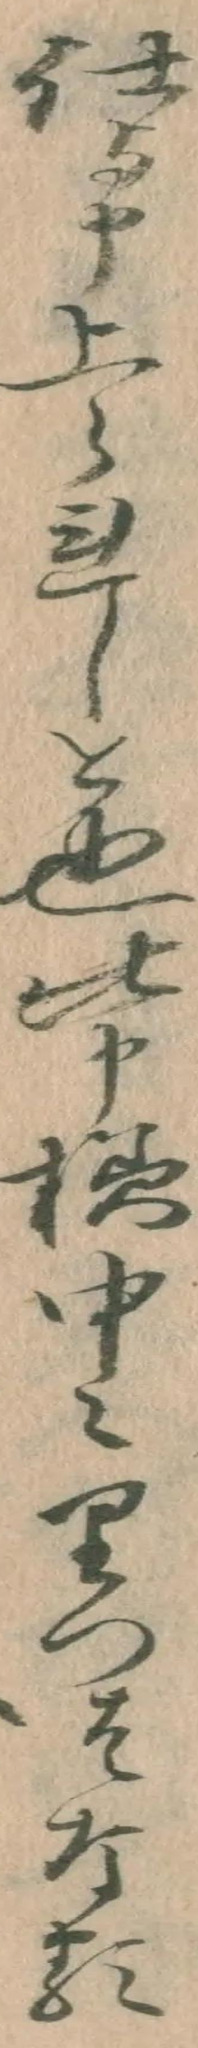仕与申上ら連しと也此申様中々里つ者な類
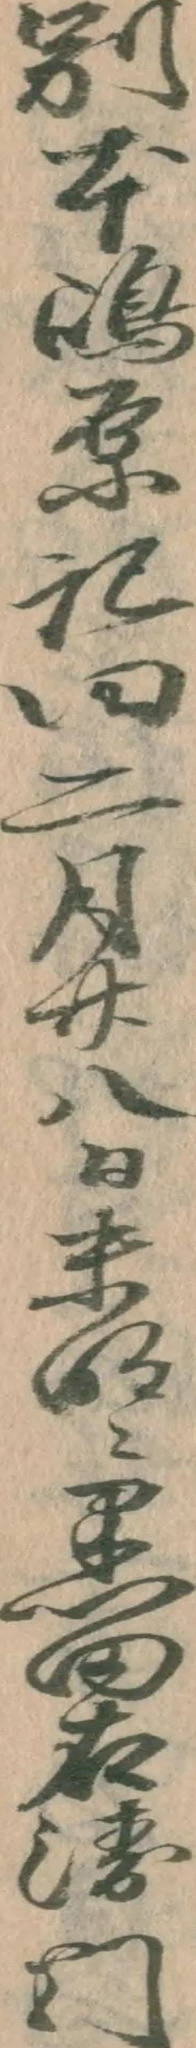別本島原記曰二月廿八日未明に黒田右衛門
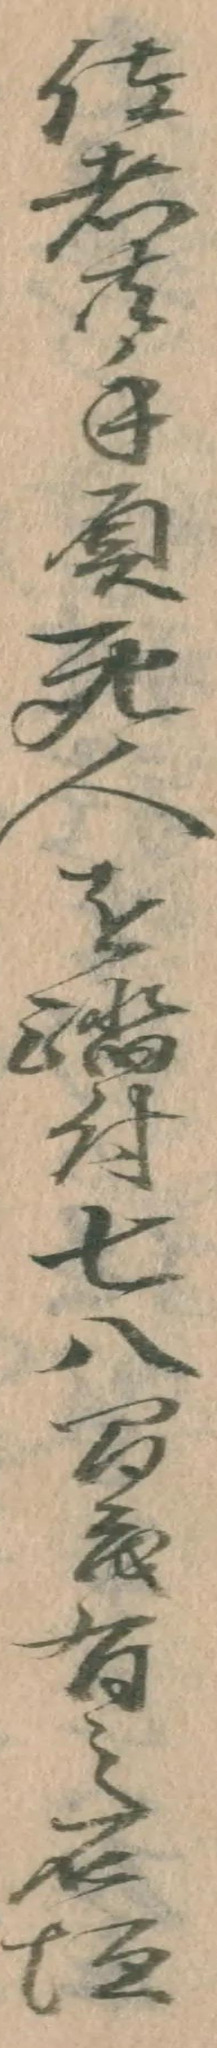佐者共手負死人を踏付七八間茂有之石垣
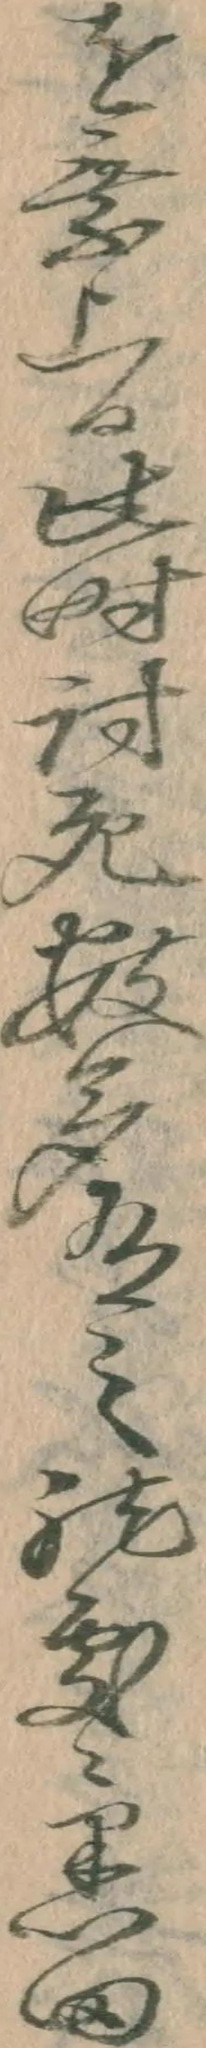を乗上る此時討死数多有之然處に黒田
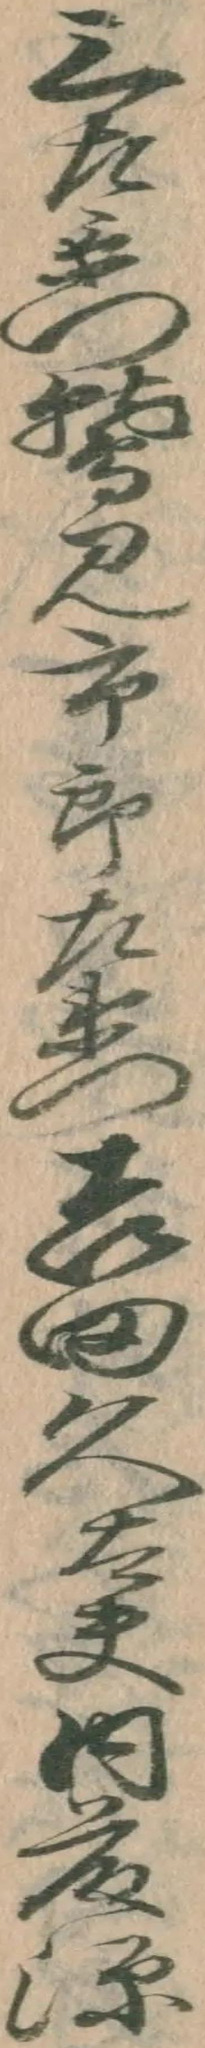三左衛門鷲見市郎左衛門吉田久太夫内藤源
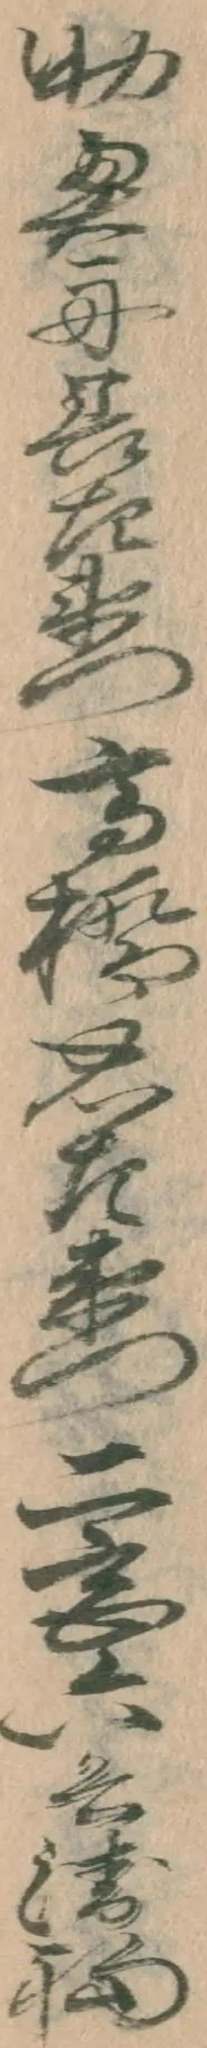助奥舟善左衛門高橋忠左衛門二宮六兵衛福
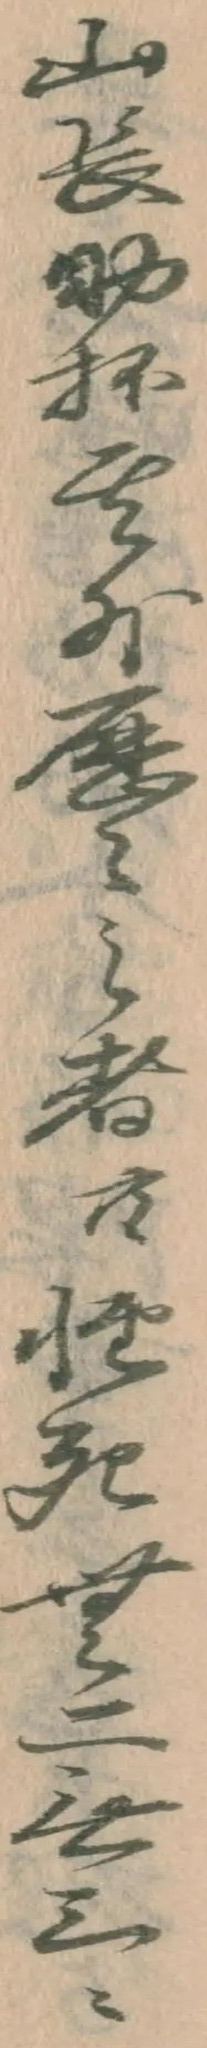山長助抔其外歴々之者共怪死無二無三に
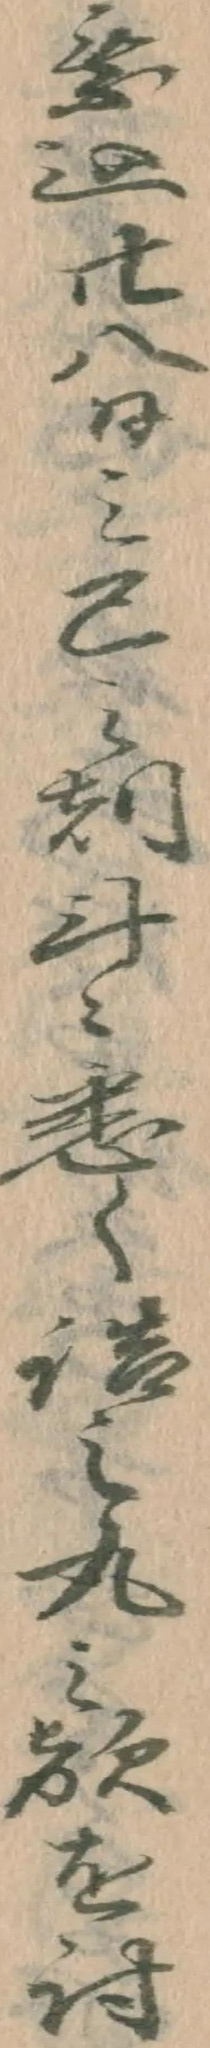乗込廿八日之巳之刻斗に悉く詰之丸之敵を討
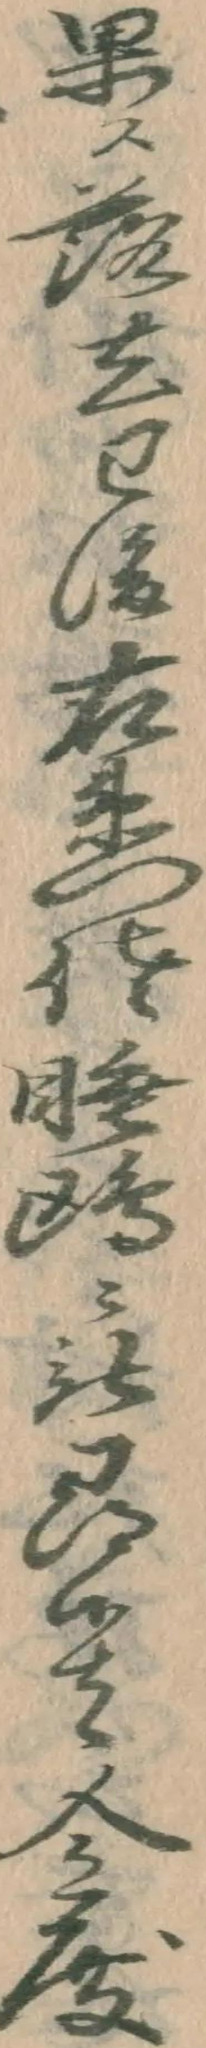果す落去已後右衛門佐睡鴎に被尋候者今度
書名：切支丹御退治記 49巻. [8]
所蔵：国立国会図書館 National Diet Library, JAPAN
